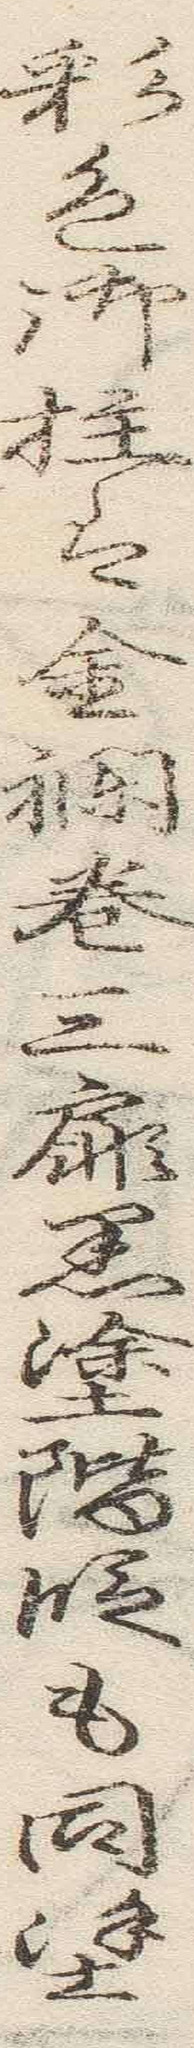彩色御柱は金襴巻三扉黒塗階段も同塗
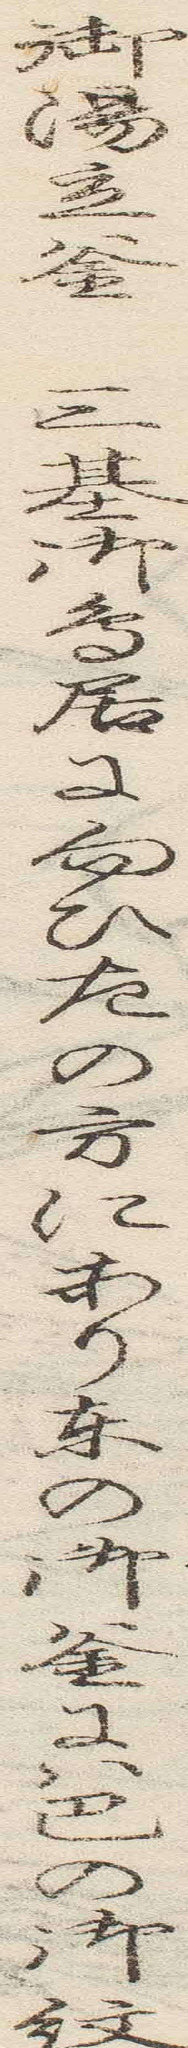御湯立釜三基御鳥居に向ひ左の方にあり東の御釜には巴の御紋
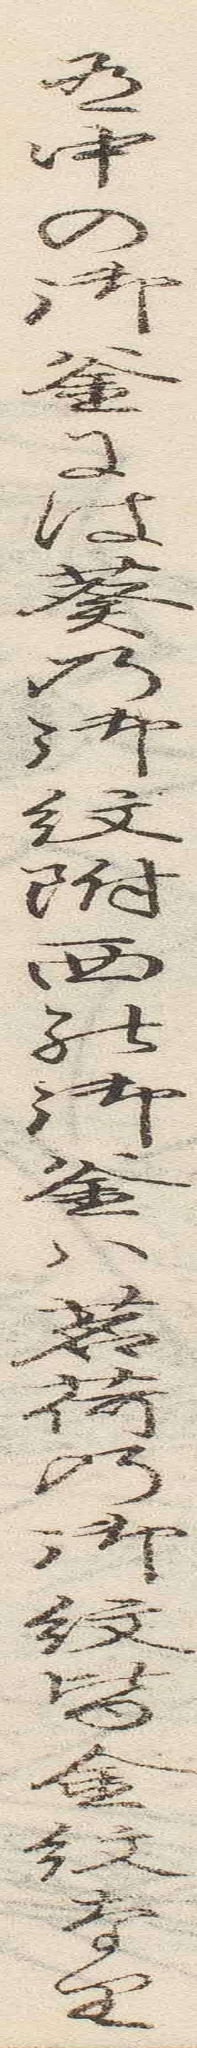有中の御釜には葵の御紋附西の御釜は茗荷の御紋皆金紋なり
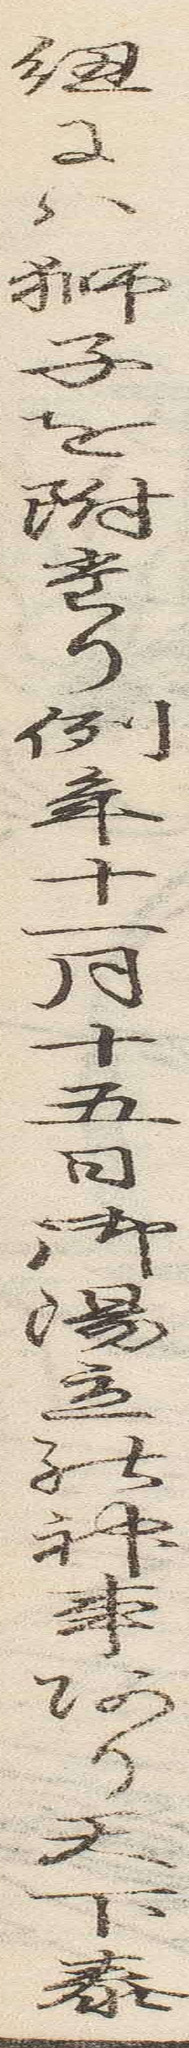紐には獅子を附たり例年十一月十五日御湯立の神事あり天下泰
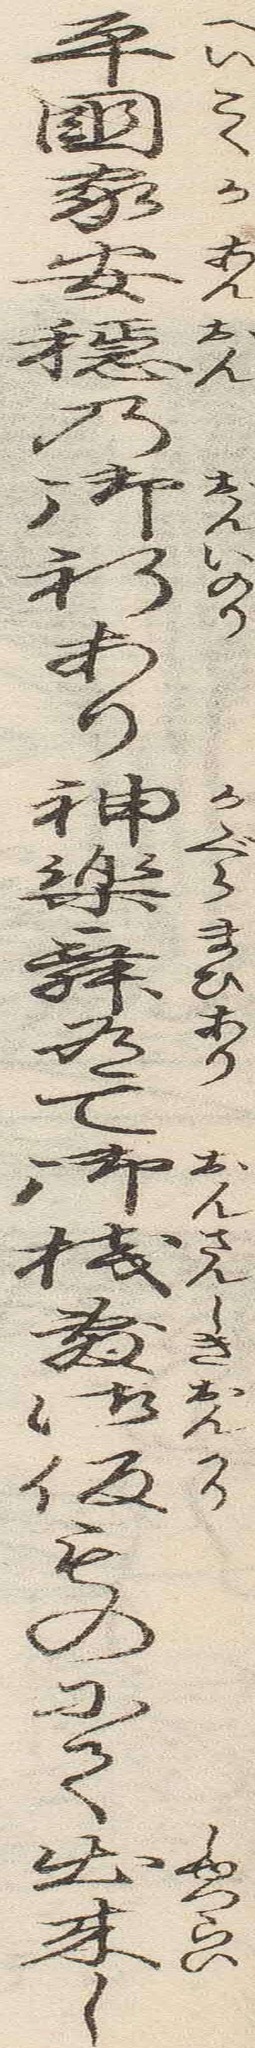平國家安穩の御祈あり神樂舞有て御桟敷御仮ものにて出來し
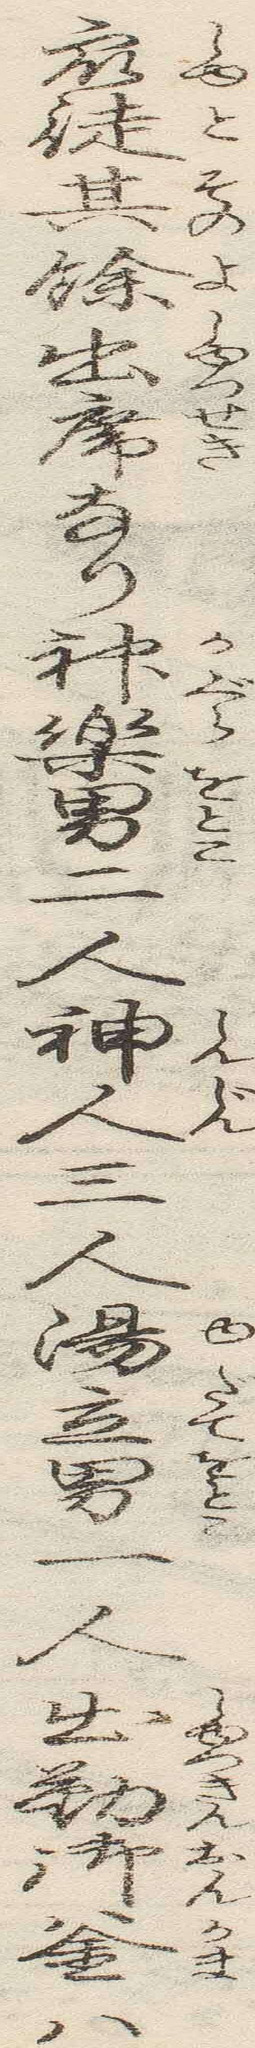衆徒其餘出席なり神樂男二人神人三人湯立男一人出勤御釜は
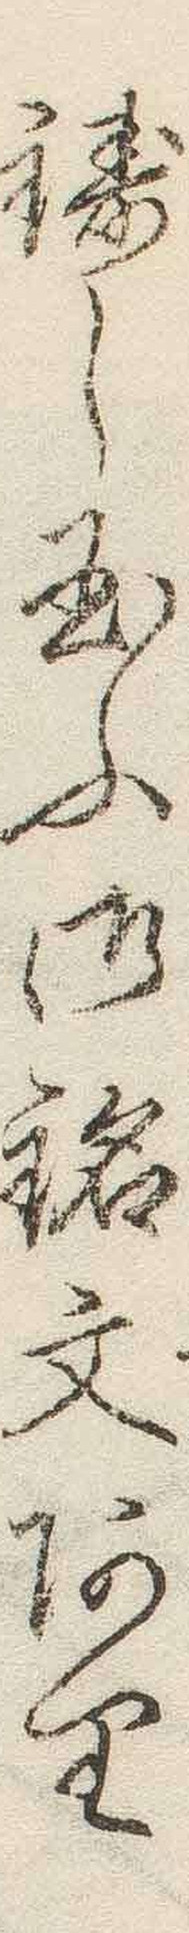鑄し玉ふ御銘文あり
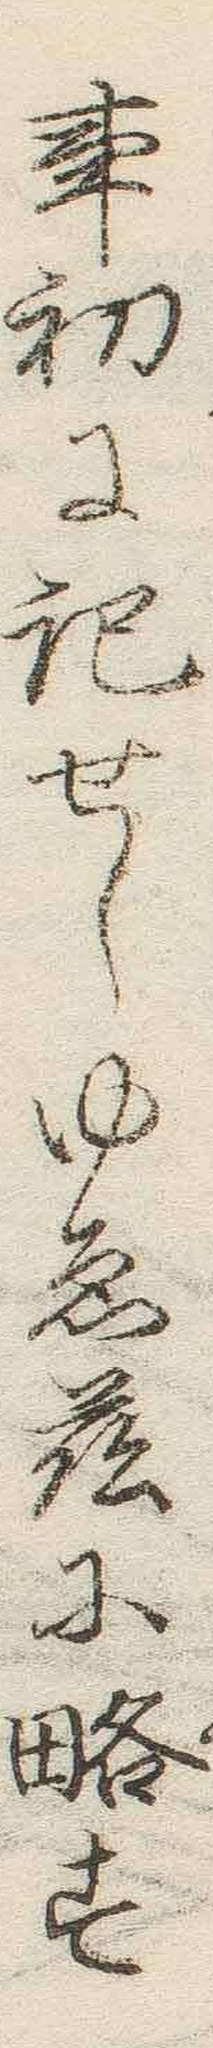事初に記せしゆゑ兹に略す
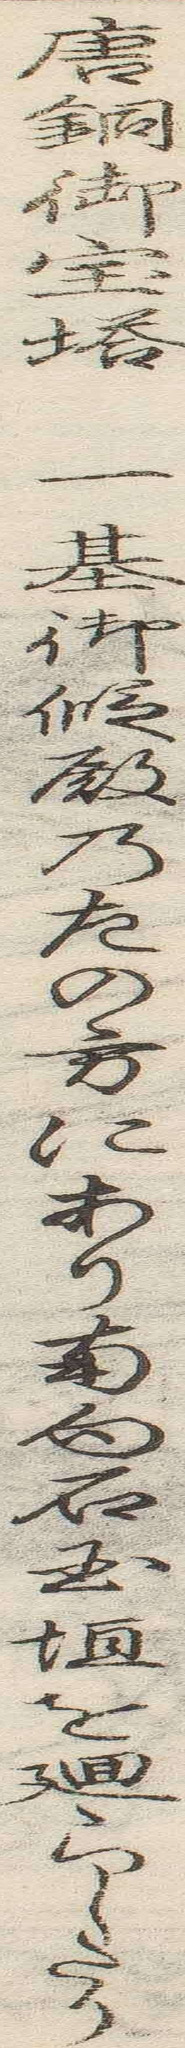唐銅御宝塔一基御假殿の左の方にあり南向石玉垣を廽らしたり
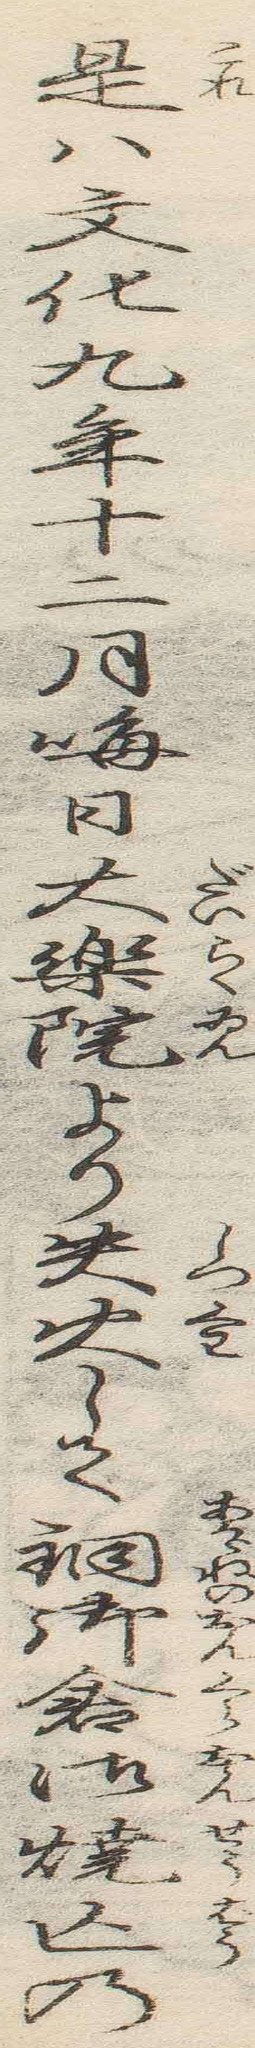是は文化九年十二月晦日大樂院より失火して銅御倉御焼亾の
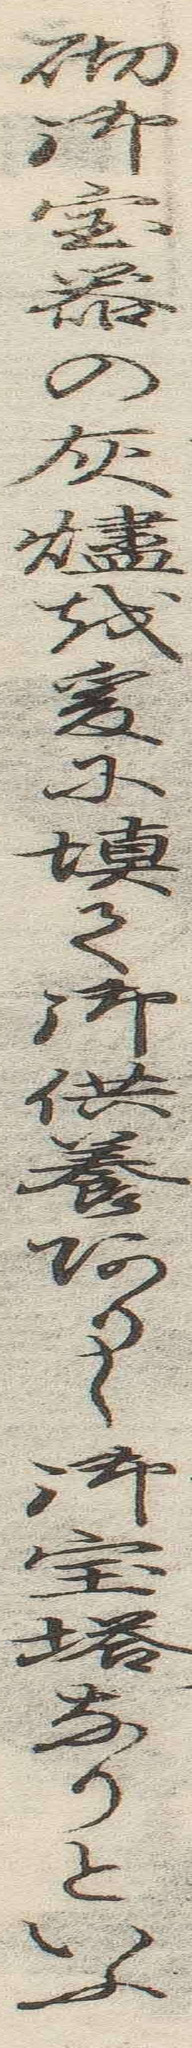砌御法器の灰燼を爰に填て御供養ありし御宝塔なりといふ
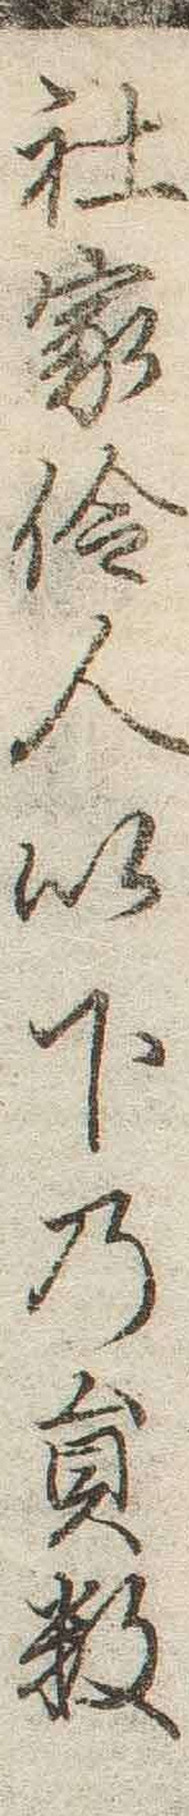社家伶人以下の貟数

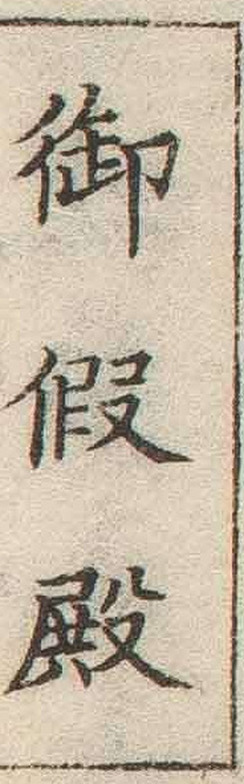御假殿
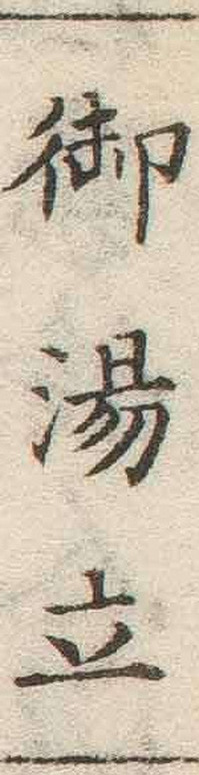御湯立

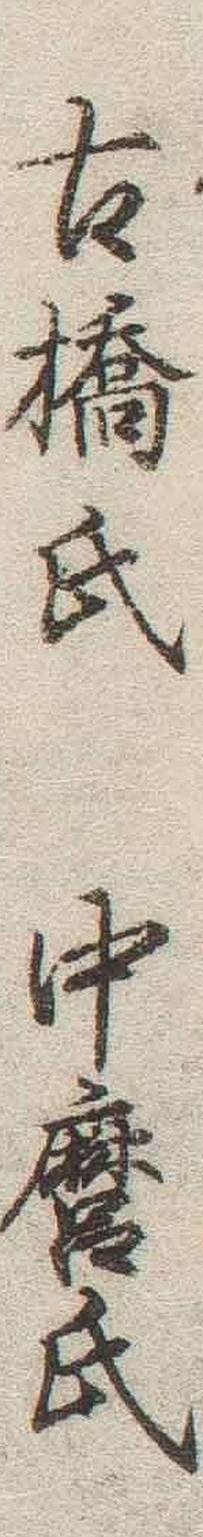古橋氏中麿氏
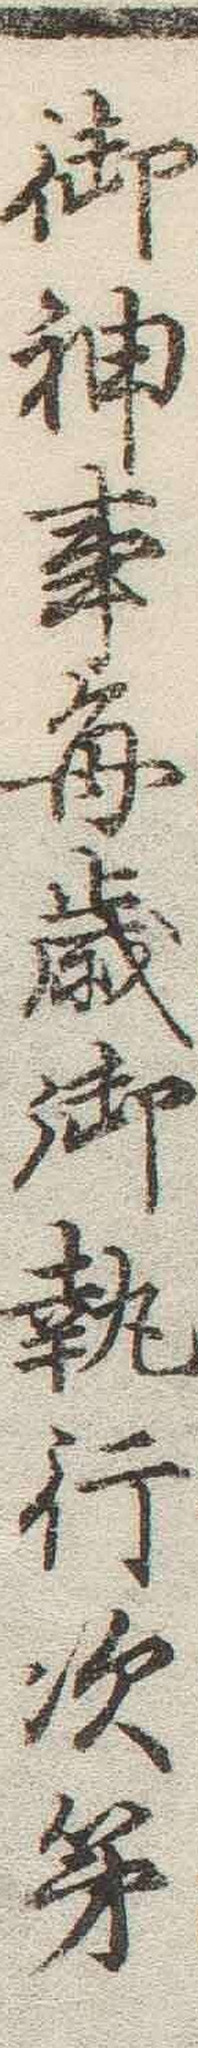御神事每歳御執行次第
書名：日光山志
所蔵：東京学芸大学附属図書館 国文学研究資料館
